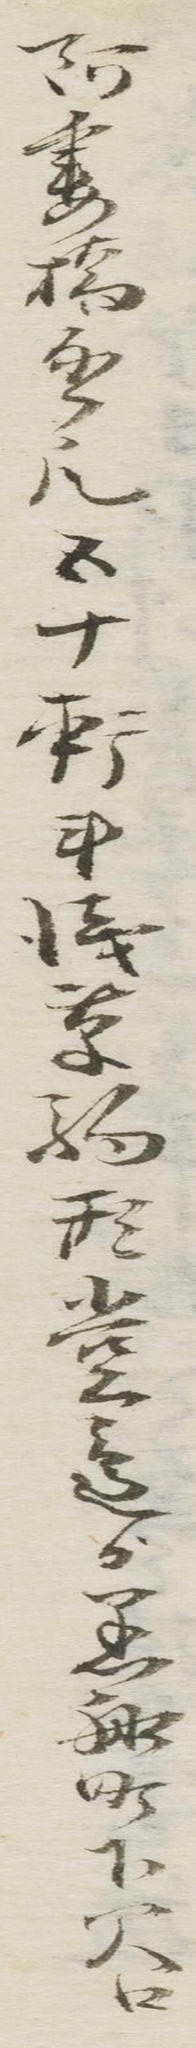吾妻橋通り凡五十軒斗浅草駒形堂辺ゟ黒船町下谷
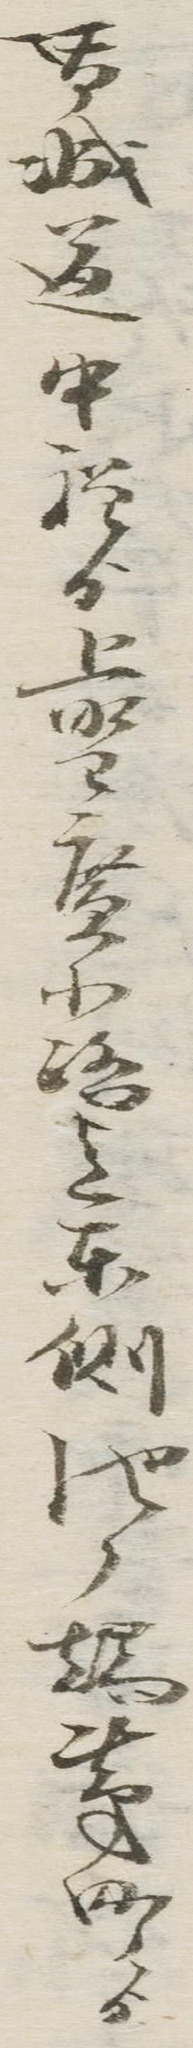御成道中程上野広小路迄東側池ノ端茅町ゟ

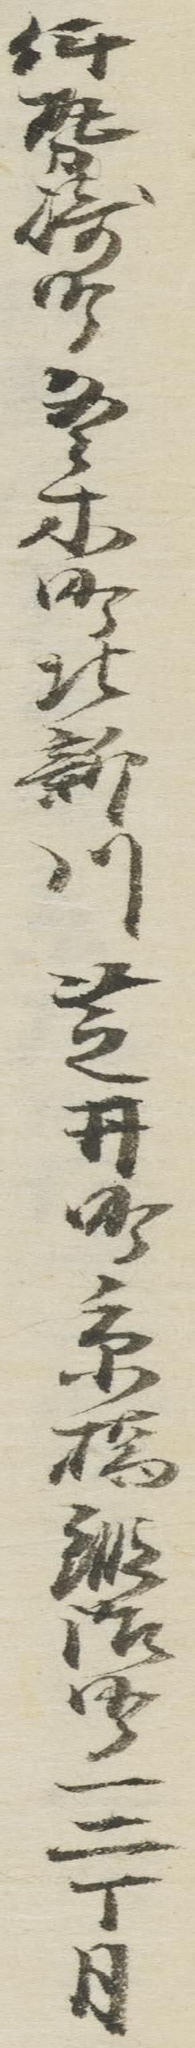伊勢崎町冬木町北新川芝井町京橋加治町一二丁目
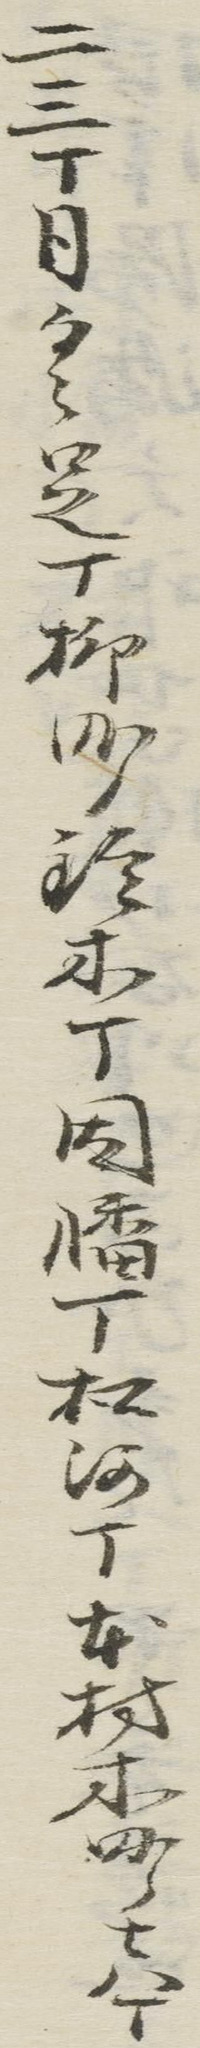二三丁目具足町柳町鈴木丁因幡丁松河丁本材木町七八丁
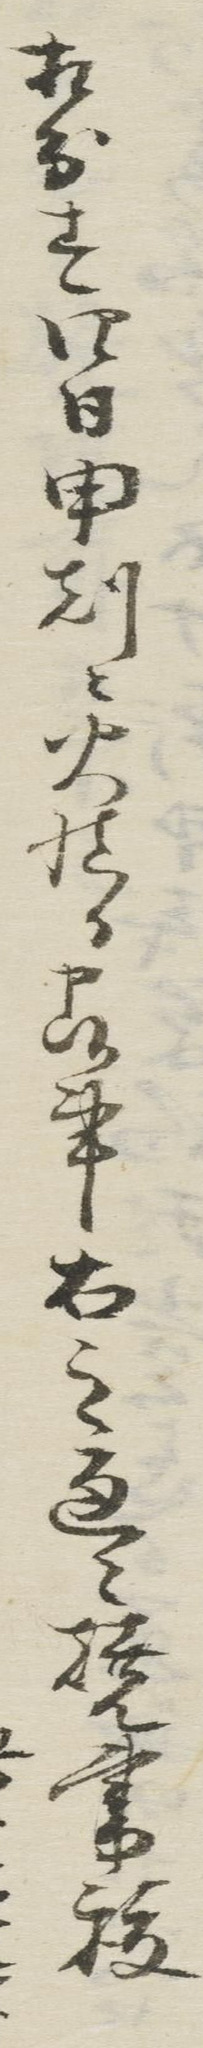相分す四日申刻ニ火鎮り申候事右之通ニ焼書抜
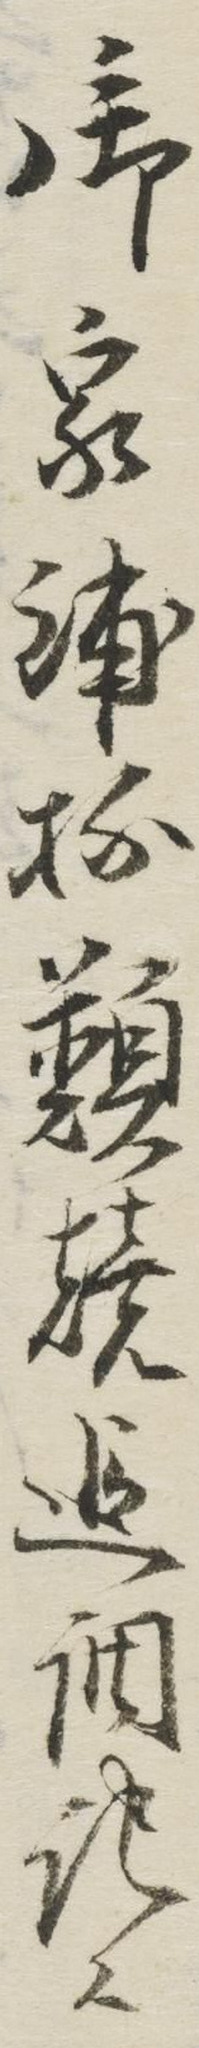御屋鋪様類焼追調記ス
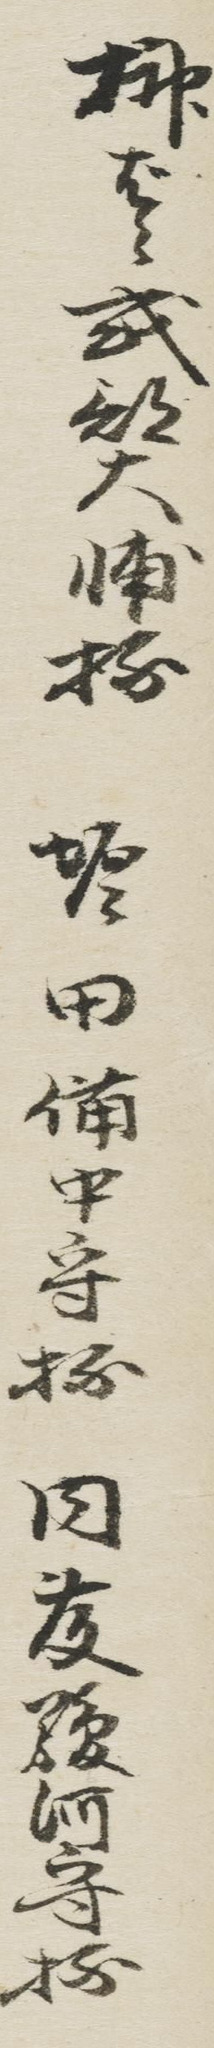榊ばら式部大輔様堀田備中守様内藤駿河守様
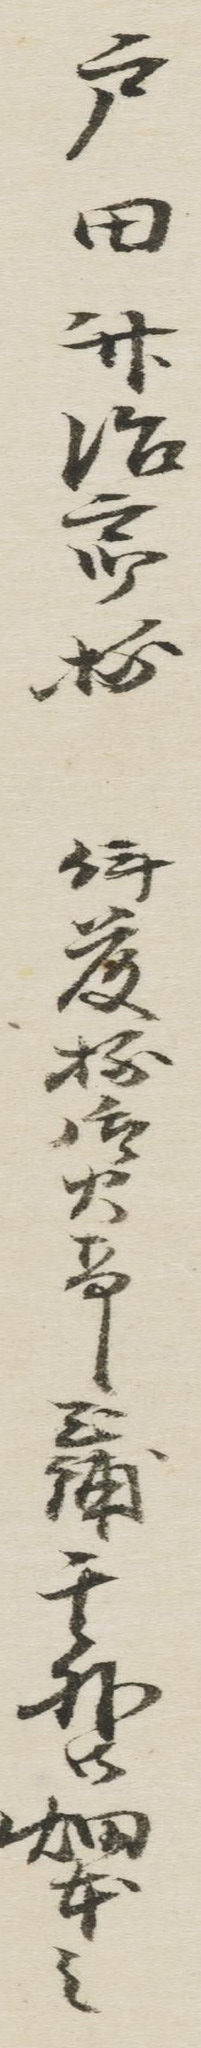戸田升治郎様伊藤様御火けし屋鋪其外御畑本之
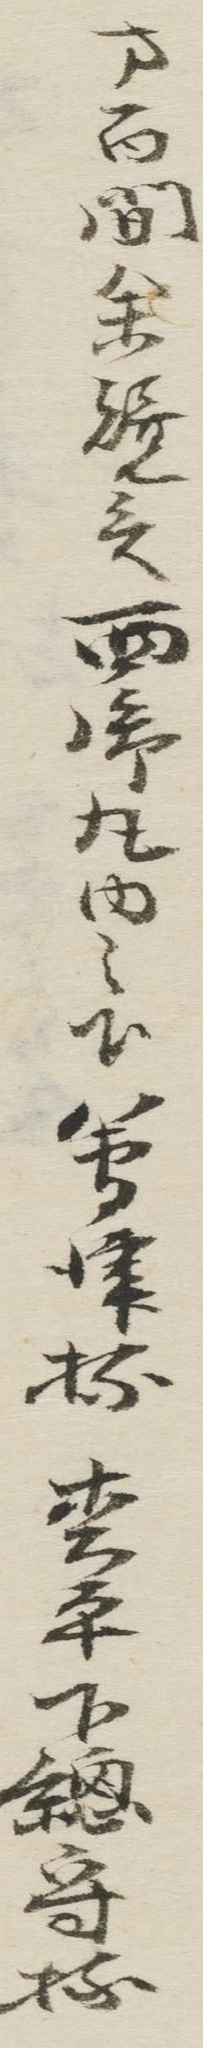方百軒余焼失西御丸内之下等津様松平下総守様
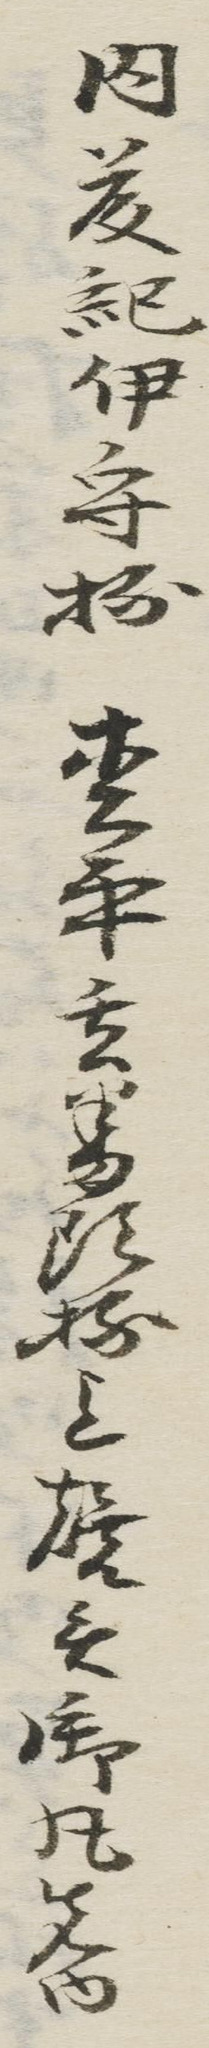内藤紀伊守様松平玄蕃頭様迄焼失御丸先内
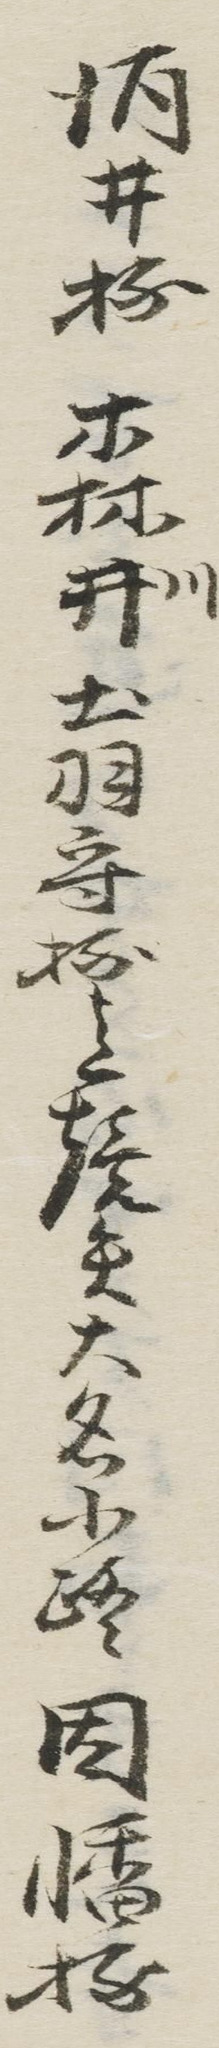酒井様森井出羽守様迄焼失大名小路因幡様
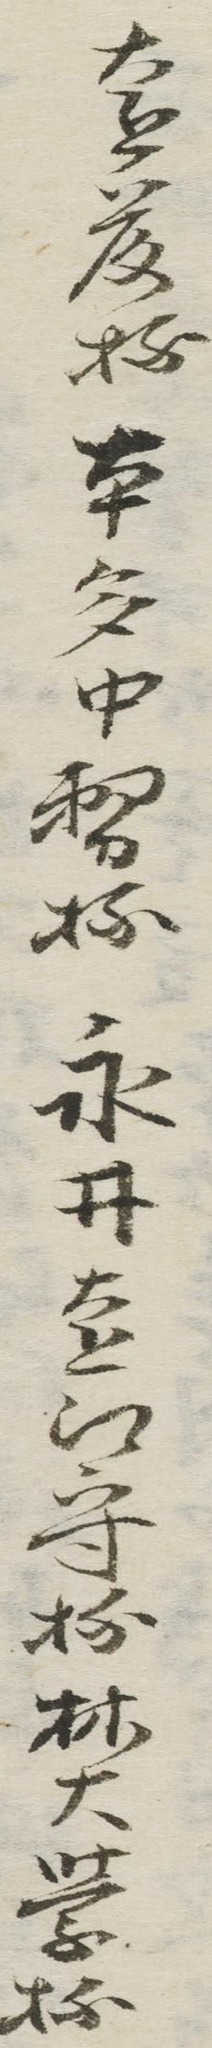遠藤様本多中務様永井遠江守様林大学様
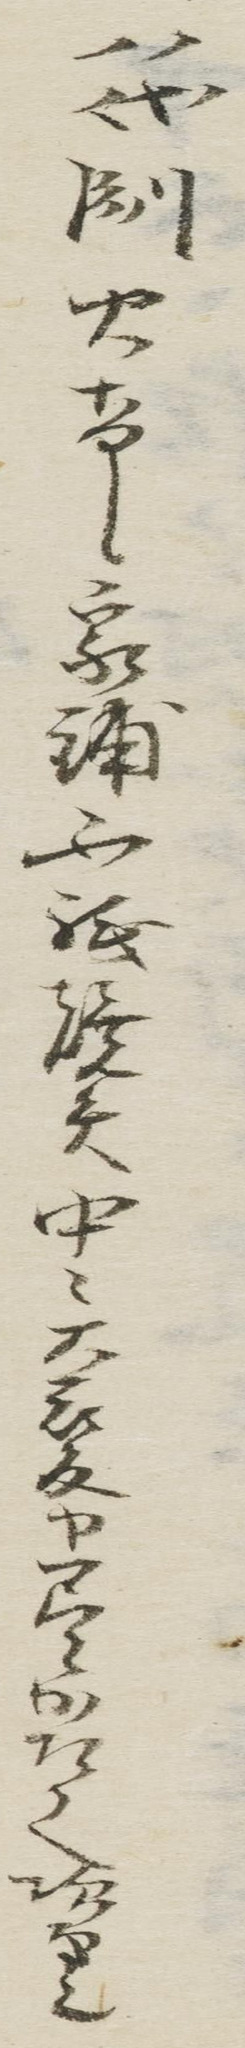八代洲火けし家鋪不残焼失中々大変申尽かたく次第也
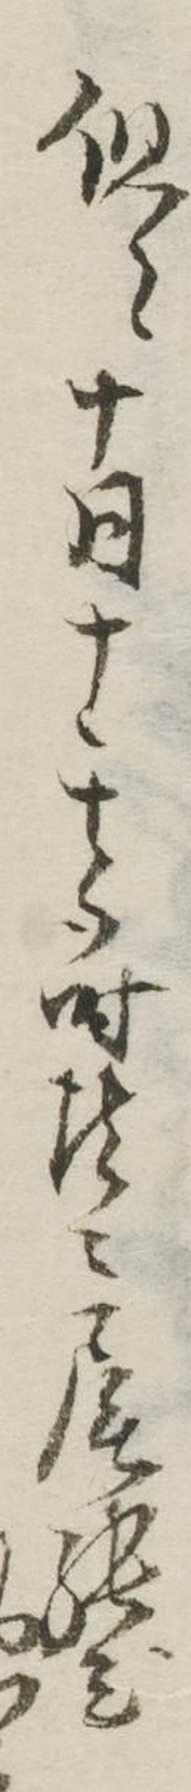但し十月十日七ッ時頃ニ尾張屋
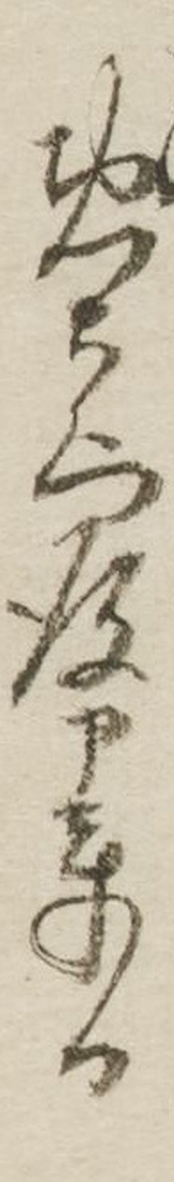惣右衛門殿申来る

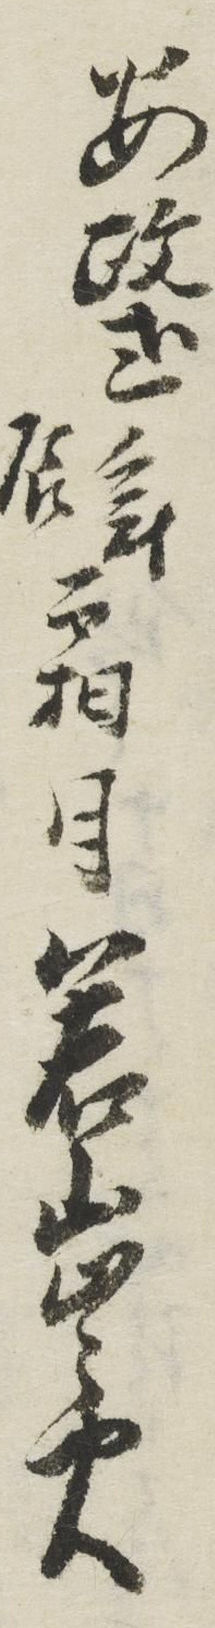安政弐年霜月若山出火
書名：諸国大地震大津波一代記
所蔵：東京大学地震研究所図書室 Earthquake Research Institute Library, The University of Tokyo, JAPAN
